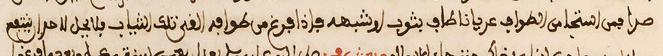صدا فمن استجا من الطواف عريا ناطاف بثوب او شبهه فاذا فرغ من طوافه القى تلك الثياب فلا يحل لاحد ان ينتفع
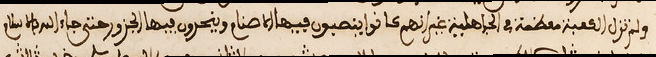ولم تزل الكعبة معظمة في الجاهلية غير انهم كانوا ينصبون فيها الاصنام وينحرون فيها الجزور حتى جاء الله بالاسلام
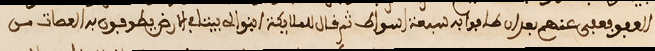العفو فعفى عنهم بعد ان طافوا به سبعة اسواط ثم قال للملايكة ابنو الى بيتا في الارض يطوفون به العصات من
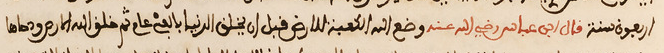اربعون سنة قال ابن عباس رضي الله عنه وضع الله الكعبة للارض قبل ان يخلق الدنيا بالفى عام ثم خلق الله الارص ودحاها
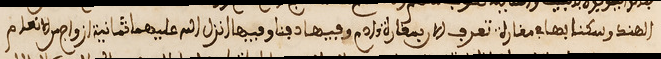الهند وسكنا بها في مغارة تعرف الان بمقارة ءادم وفيها دفنا وفيها انزل الله عليهما ثمانية ازواج من الانعام
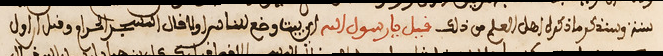سنة وسنذكر ما ذكره اهل العلم من ذلك قيل يا رسول الله اي بيت وضع للناس او لا قال المسجد الحرام وقيل ان اول
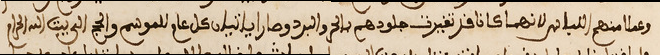وعملا منهم اللباس لانهما كانا قد تغيرت جلودهم بالحر والبرد وصارا ياتيان كل عام للموسم والحج الى بيت الله الحرام
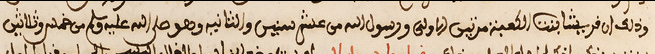وذلك ان قريشا بنت الكعبة مرتين الاولى ورسول الله من عشر سنين والثانيه وهو صلى الله عليه وسلم من خمس وثلاثين
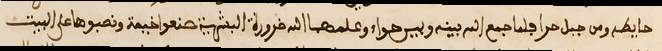حايطه ومن جبل حرا فلما جمع الله بينه وبين حواء وعلمهما الله ضرورة البشرية صنعوا خيمة ونصبوها على البيت
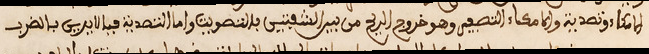الامكاء وتصدية والامكاء التصفير وهو خروج الريح من بين الشفتين بالتصويت واما التصدية فبالايدين بالضرب
